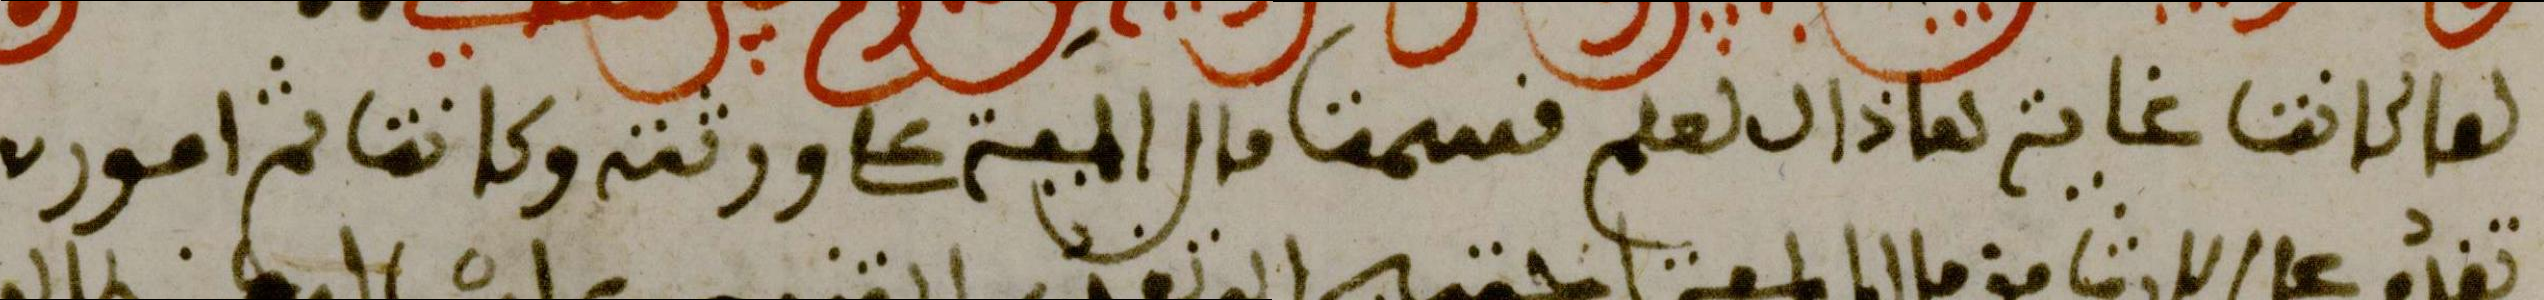لما كانت غاية هاذا العمل قسمت مال المية على ورثته وكانت ثم امور
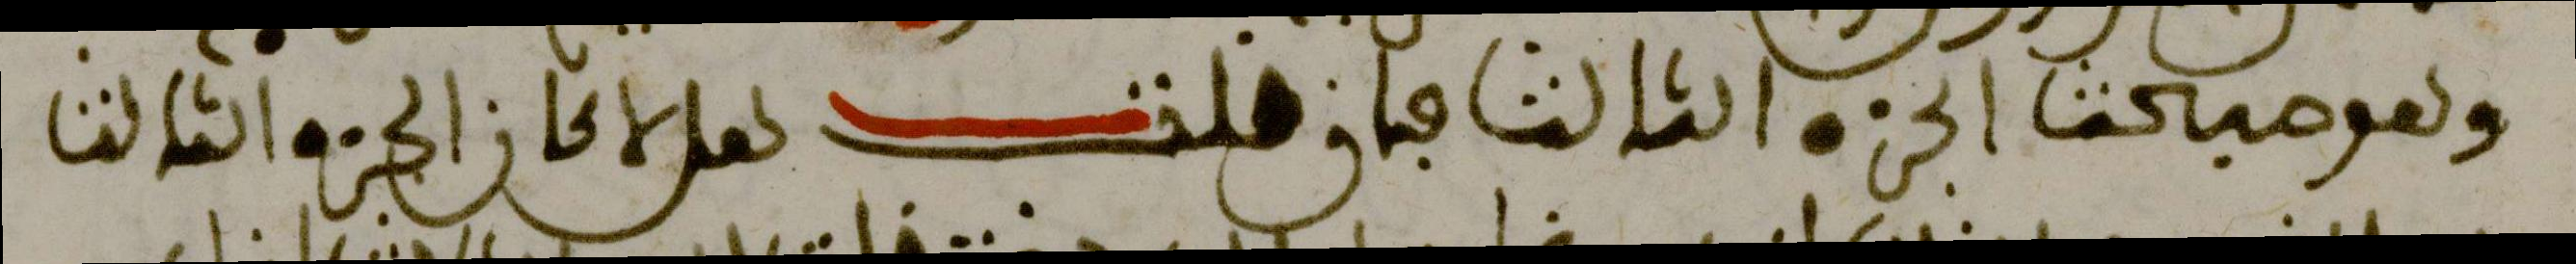وهو مبحث الجزء الثالث فان قلت هل لا كان الجزء الثالث
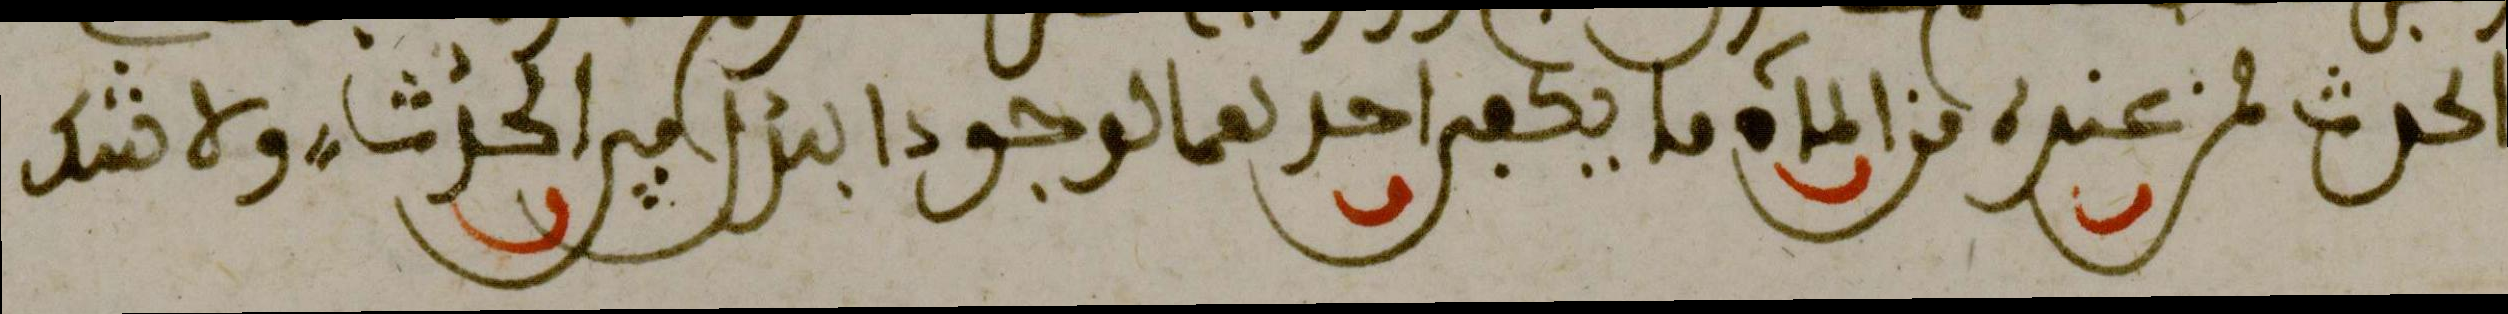الحدث لمن عنده من الماء ما يكفى احدهما لوجود البدل في الحدث ولاشك
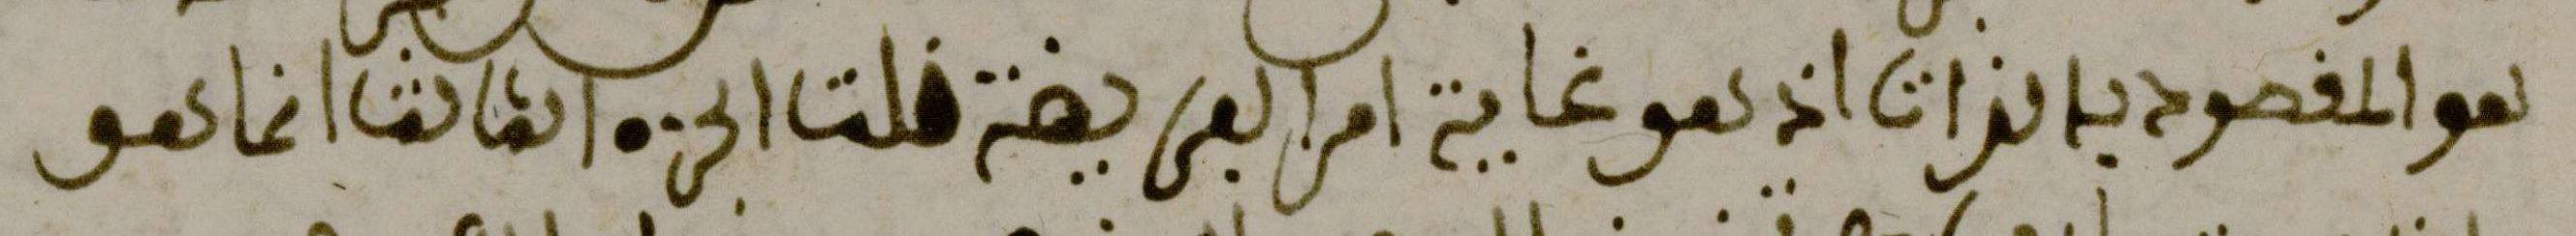هو المقصود بالذات هو غاية امر الفريضة قلت الجزء الثالث انما هو
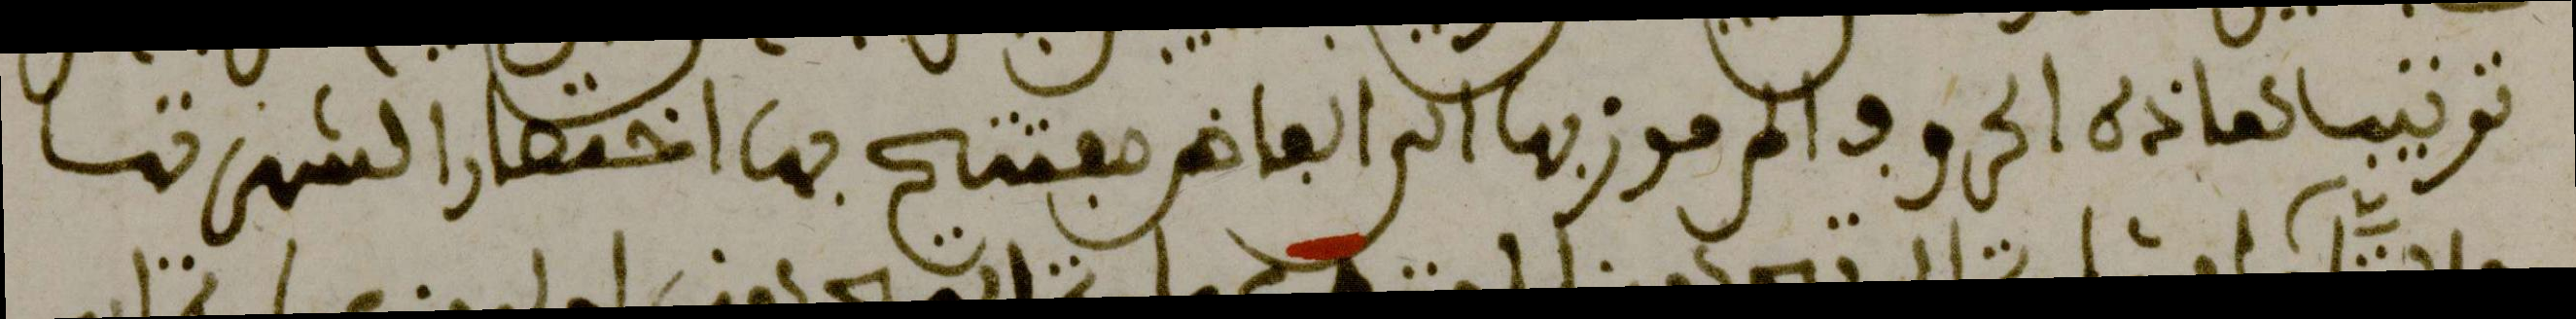ترتيب هاذه الحروف المرموز بها الى الفاض مفتتح بها اختصار الشهرتها
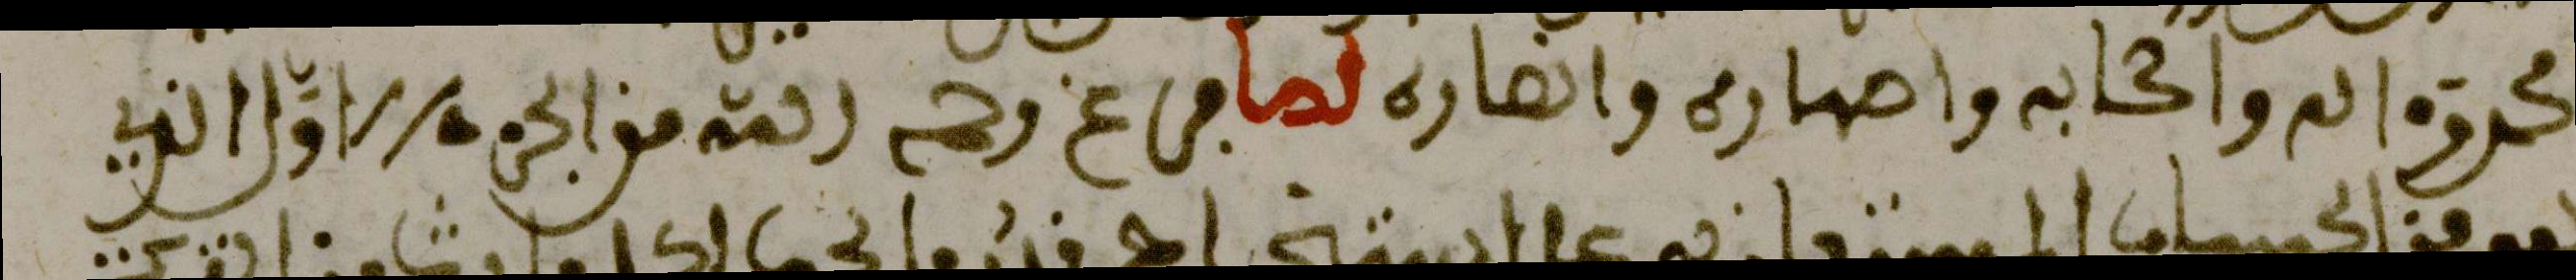محمد وءاله واصحابه واصاره وانصاره لما فرغ رحمه الله من الجزء الاول الذي
